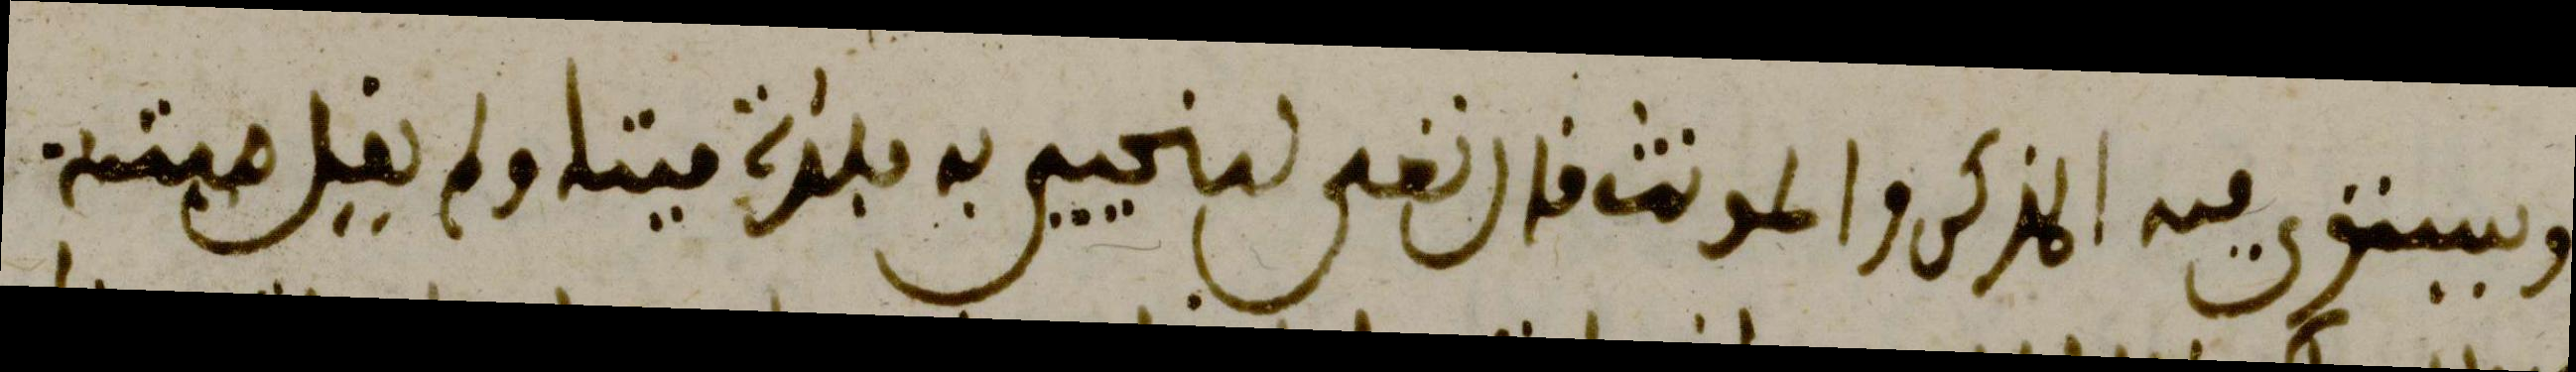ويستوى فيه المذكر والمونث قال تعلى لنحيي به بلدة ميتا ولم يقل ميته
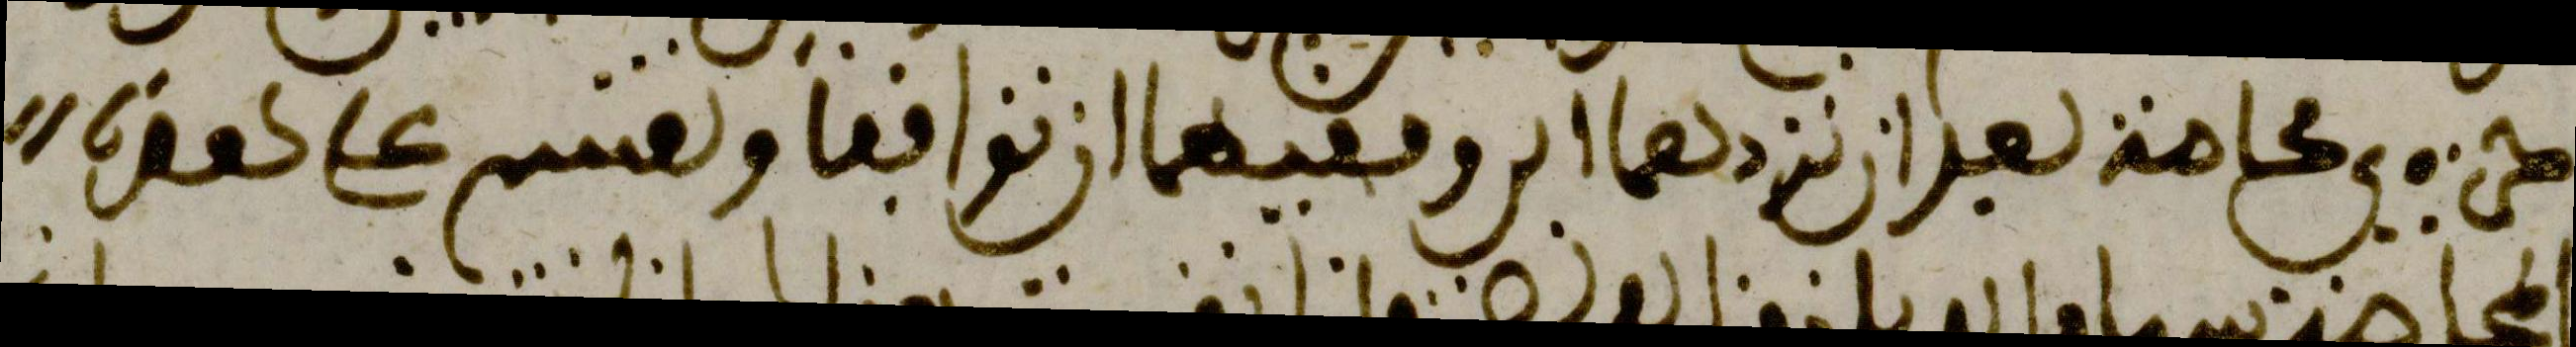جزء محاصة بعد ان تردهما الى وفقيهما ان توافقا وتقسم على هذه
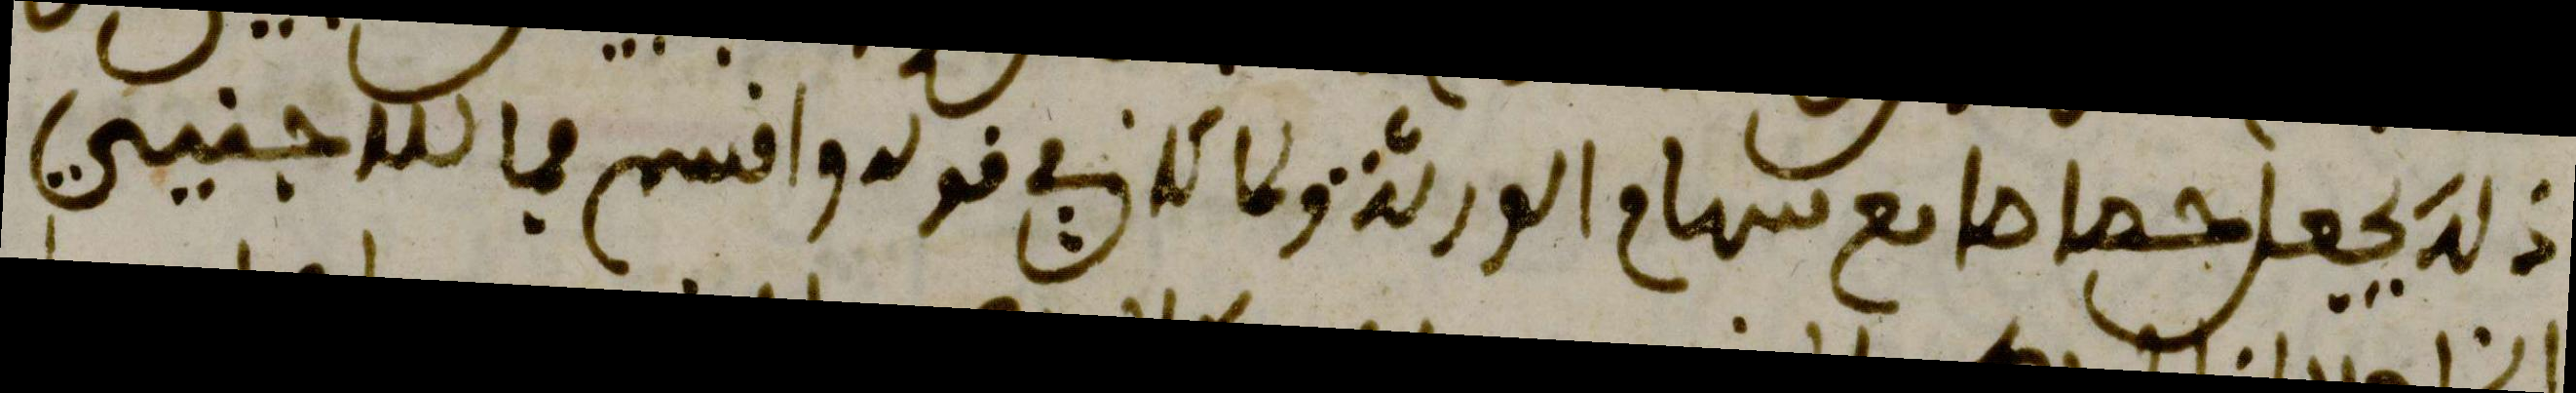ذلك يجعل حصاصا مع سهام الورثة ولما كان في قوله واقسم فما للاجنبي
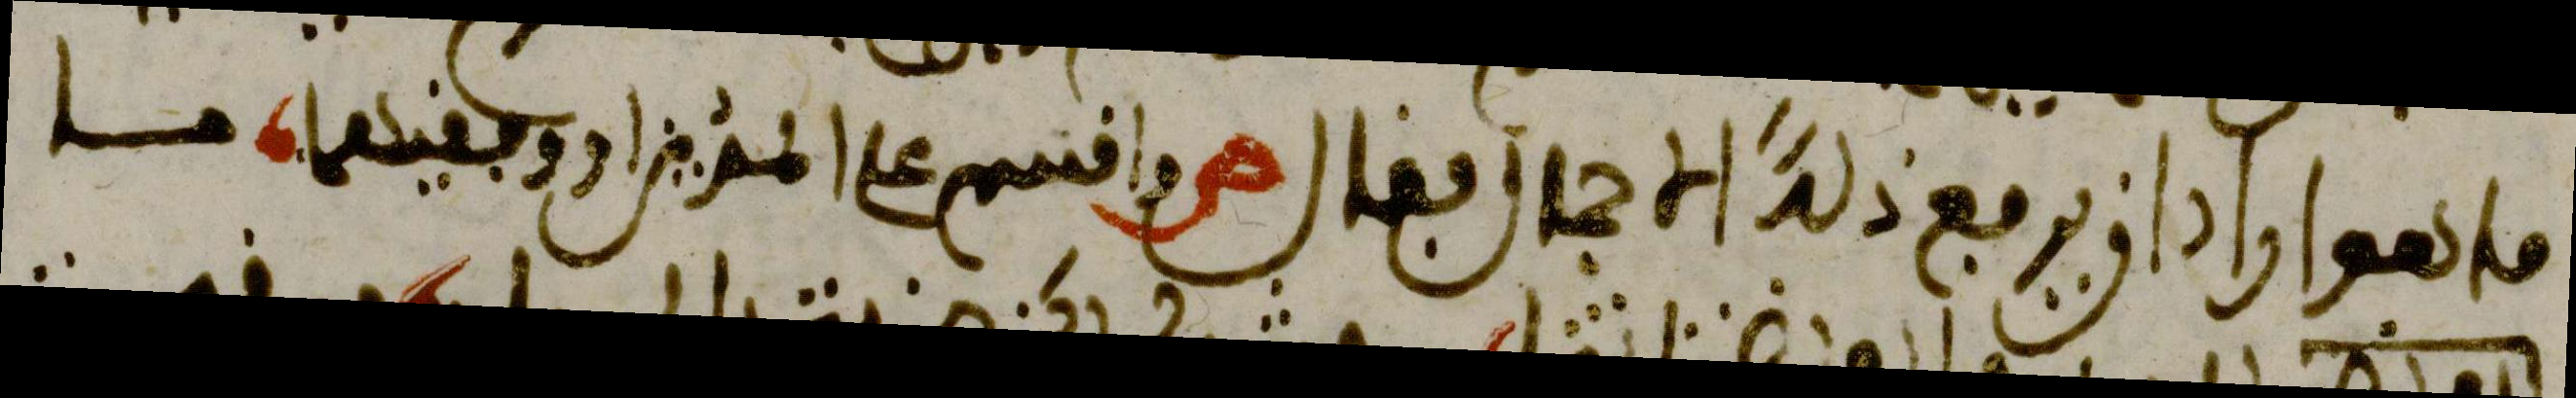ما هو اراد ان يرفع ذلك الاجمال فقال ص واقسم على المدين او وفقيهما ما
